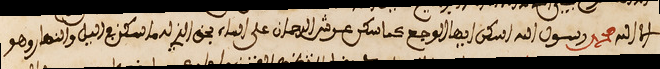الا الله محمد رسول الله اسكن ايها الوجع كما سكن عرش الرحمان على الماء بحق الذي له سكن في اليل والنهار وهو
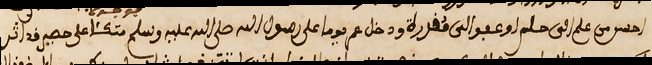احسن من علم الى حلم او عفو الى مُقدرة ودخل عمر يوما على رسول الله صلى الله عليه وسلم متكئا على حصير قد اثر
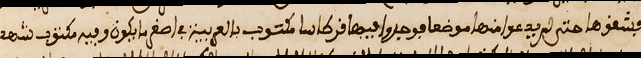فشقوها حتى لم يدعوا منها موضعا فوجدوا فيها قرطاسا مكتوب بالعربية في اصغر ما يكون وفيه مكتوب شهد
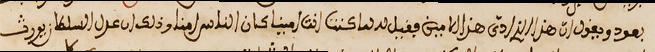بعود ويقول ان هذا الذي ادّى هذا الامين فقيل له كنت انت امينا كان الناس امنا وذلك ان عدل السلطان يورث
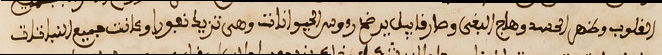القلوب وظهر الحسد ووهاج البغى وصار قابيل يرضخ رءوس الحيوانات وهى تزيد نفورا وكانت جميع النباتات
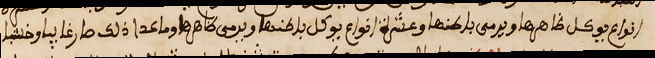انواع يوكل طاهرها ويرمى باطنها وعشرة انواع يوكل باطنها ويرمى ظاهرها وما عدا ذلك صار غابيا وخشبا
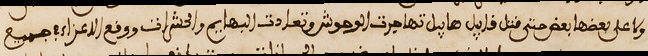ولا على بعضها بعض حتى قتل قابيل هابيل تهاجرت الوحوش وتعاددت البهايم الحشرات ووقع الاعذاء في جميع
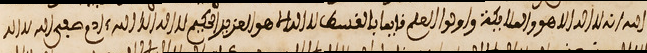الله انه لا اله الا هو والملايكة واولو العلم قايما بالقسط لا اله الا هو والعزيز الحكيم لا اله لا الله ءادم صفى الله لا اله
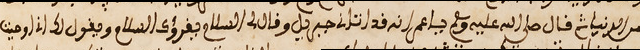من الدنيا ثم قال صلى الله عليه وسلم يا عمر انه قد اتانى جبريل وقال لى السلام يقرؤك السلام ويقول لك انى اوحيت
